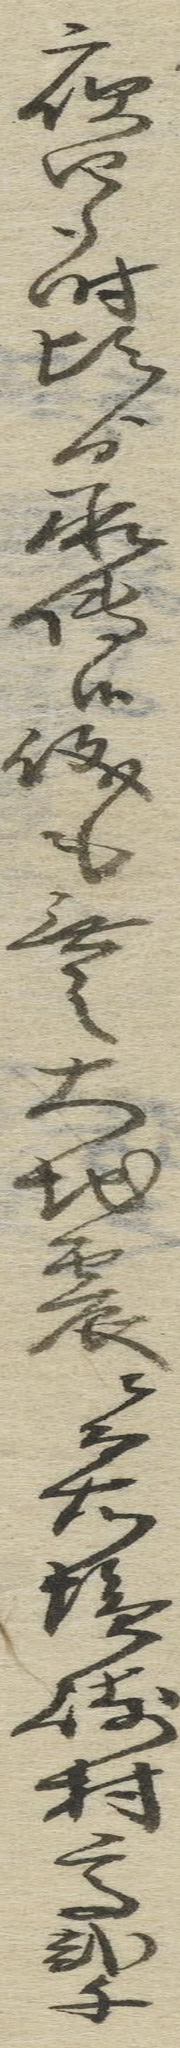夜四ッ時頃承伝候儀も無之大地震二而右塩崎村高弐千
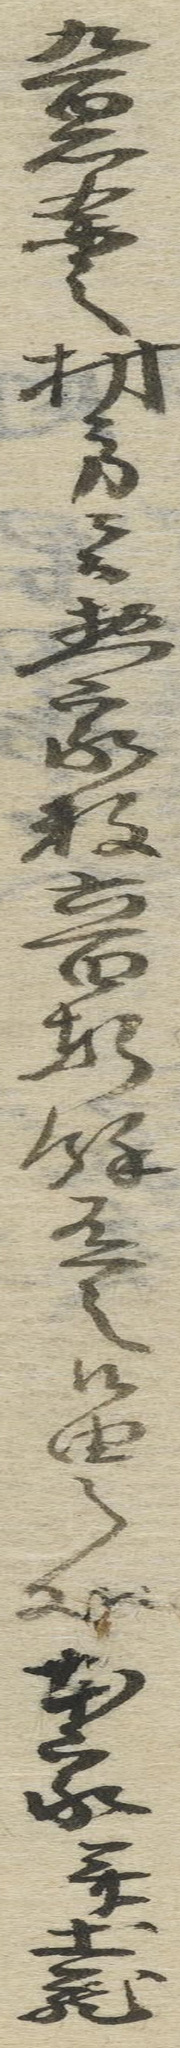九百石余之村方二而惣家数六百軒餘有之候由之処本家并土蔵
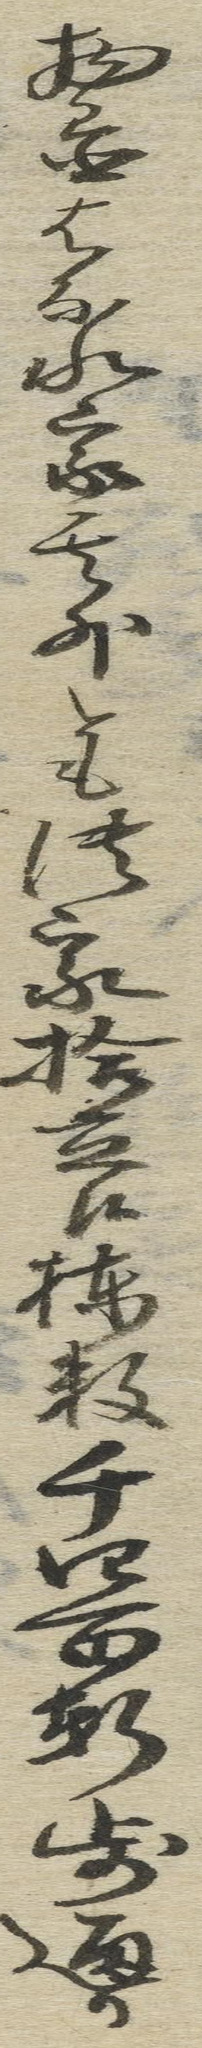物置はなれ家其外とも潰家捨立候棟数千四百軒歩通り
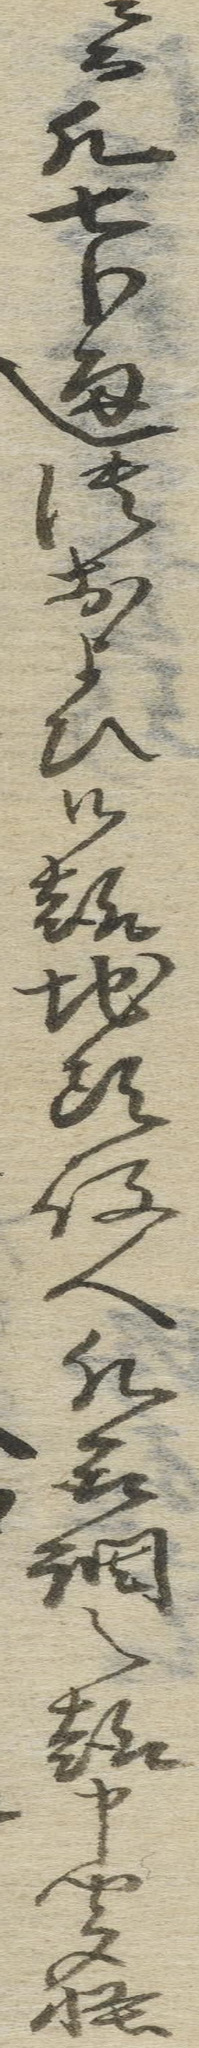二而凡七分通潰およひ候趣地頭役人凡取調之趣申聞候怪
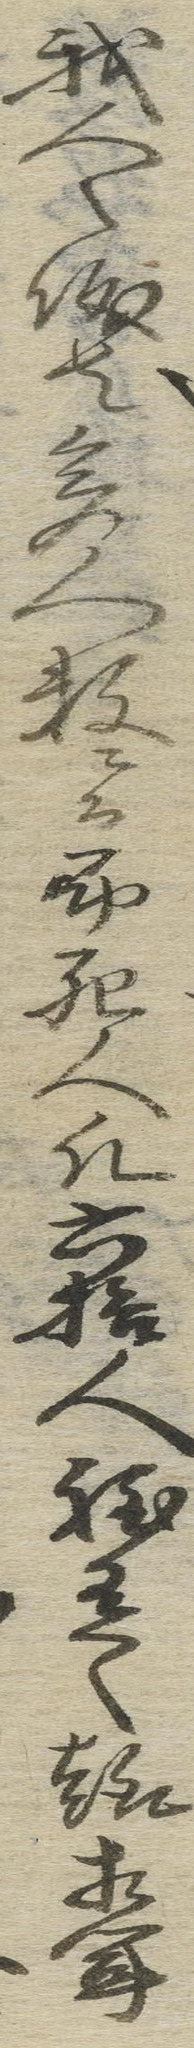我人之儀は多人数二而即死人凡六拾人程有之趣相聞
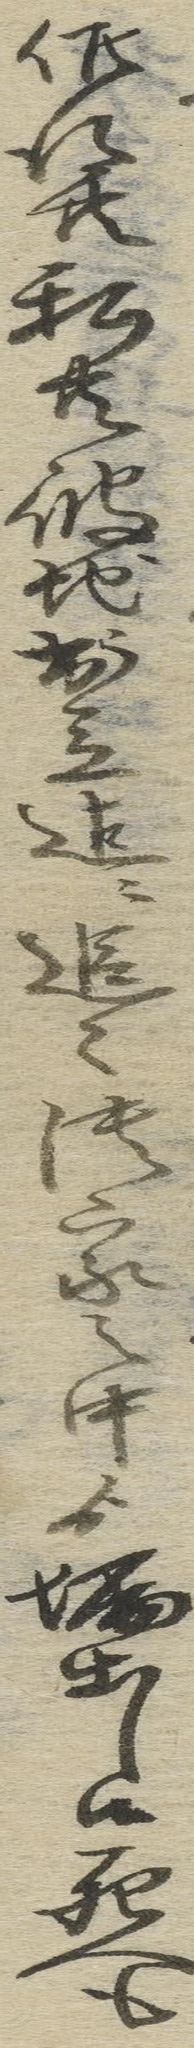候得共私共彼地出立迄二追々潰家之中ゟ掘出候死人も
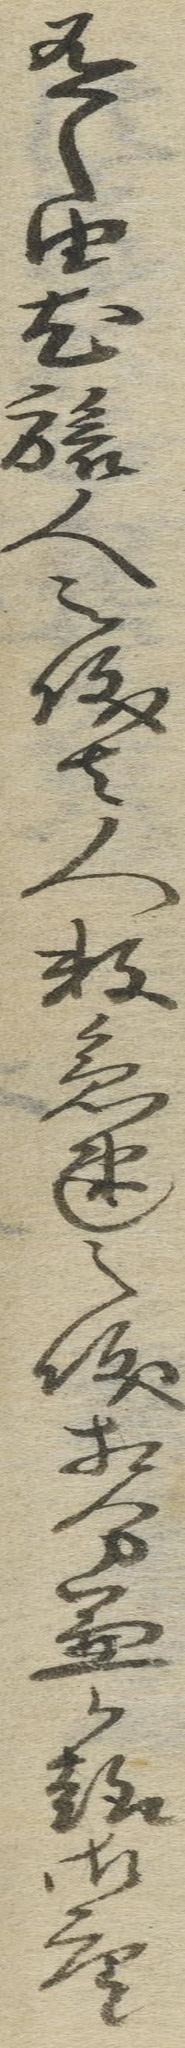有之由故尤旅人之儀は人数急速之儀相分兼候趣二御座候
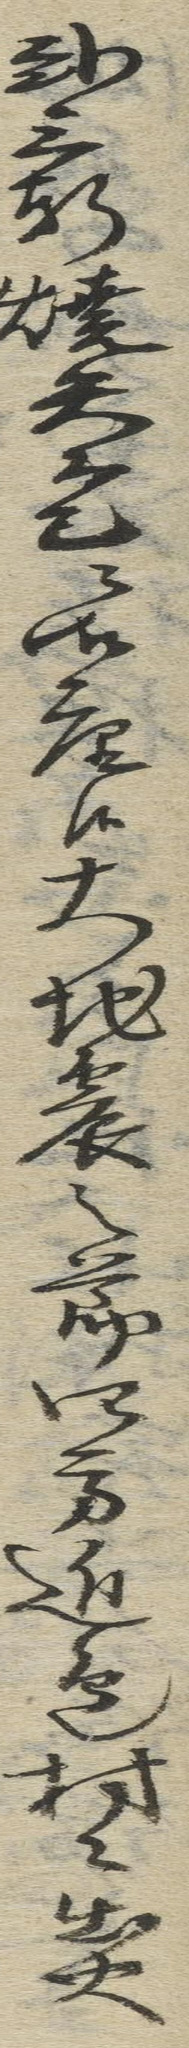弐三家焼失而已二御座候大地震之節四方近辺村々出火
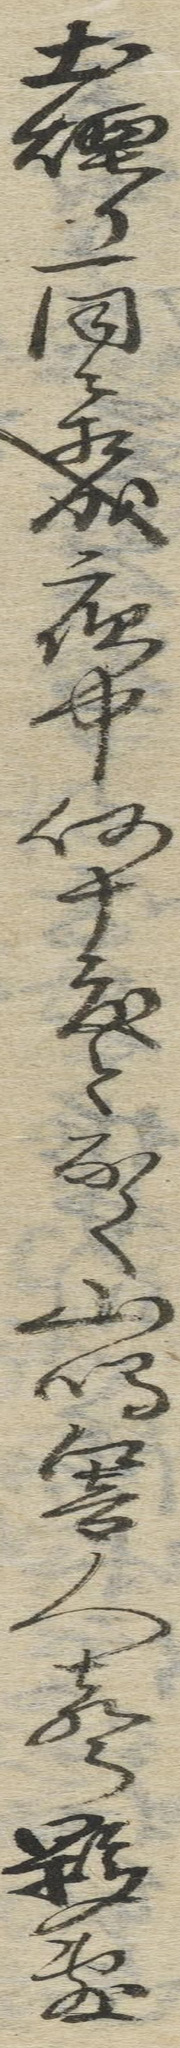土煙り一同二相成夜中何十度となく之山鳴響人声夥敷
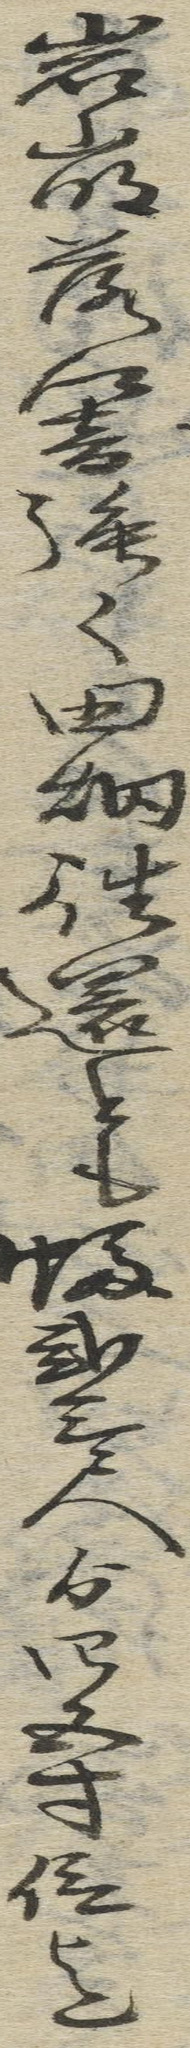岩崩落響強く田畑往還とも幅弐三尺ゟ五寸位迄
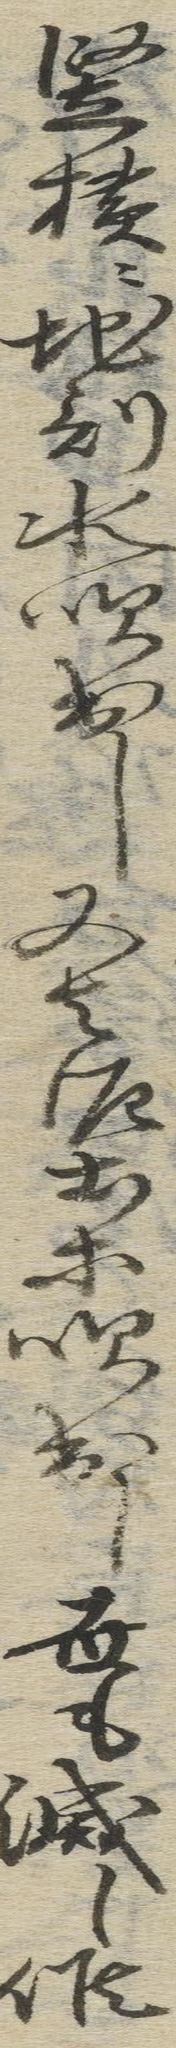竪横二地割水吹出し又は泥土等吹出し世も滅し候
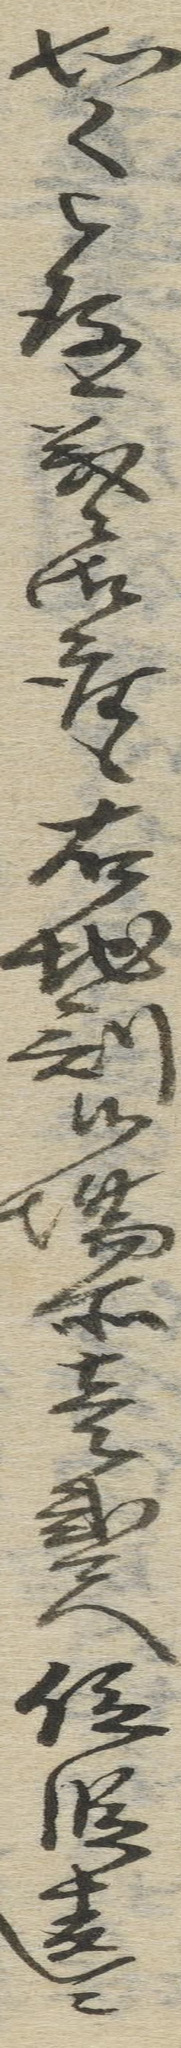如く被存候義二御座候右地割候場所壱弐尺位段違二
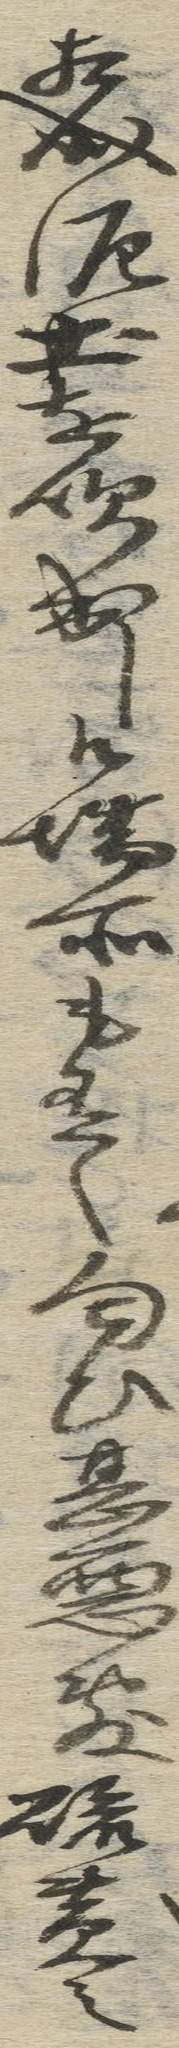相成泥水を吹出し候場所も有之匂ひ甚悪敷硫黄之
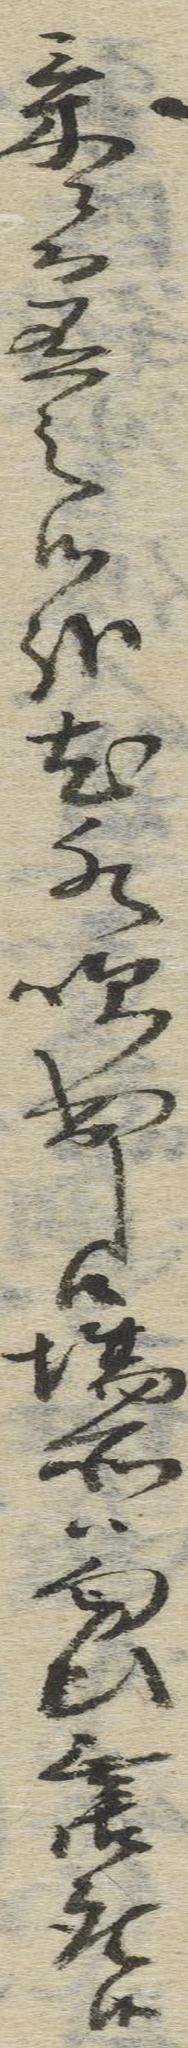気二而有之候哉尤水吹出し候場所ハ匂ひ無御座候
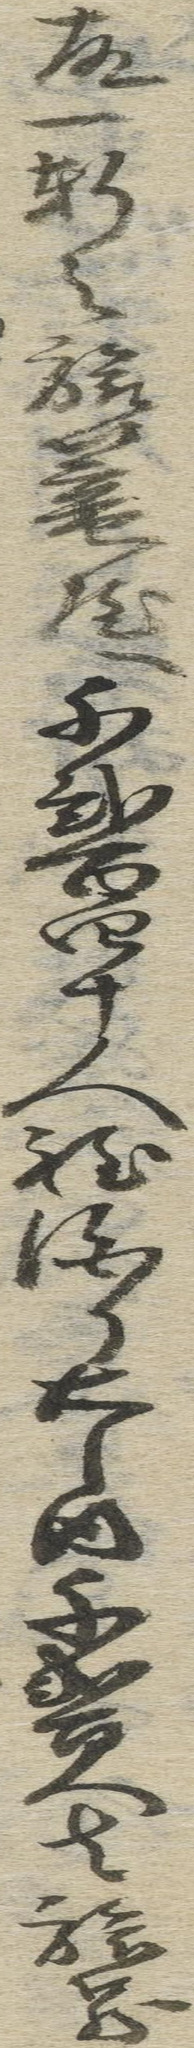故壱軒之旅籠屋へ千弐百四拾人程泊り右之内千弐百人は旅籠
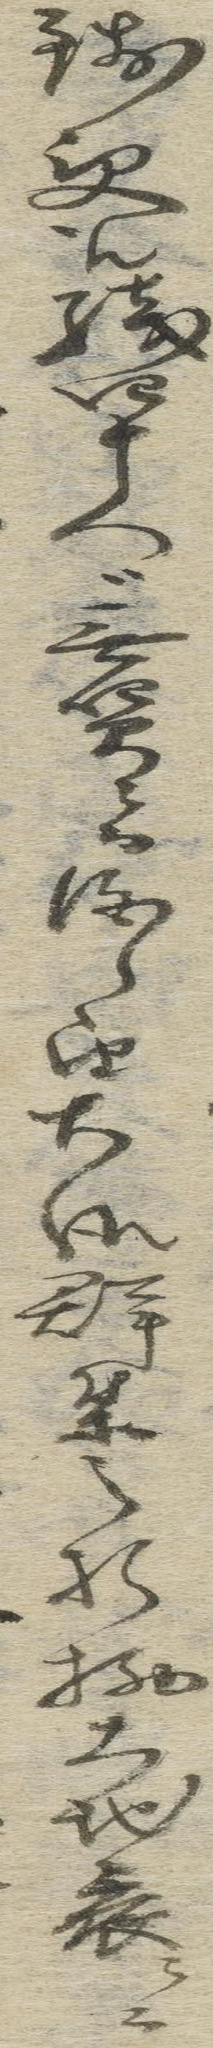銭受取残四拾人ハ無賃二而泊り候由右様群集之折柄大地震二而
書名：信濃越後　地震書留
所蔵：東京大学地震研究所図書室 Earthquake Research Institute Library, The University of Tokyo, JAPAN
